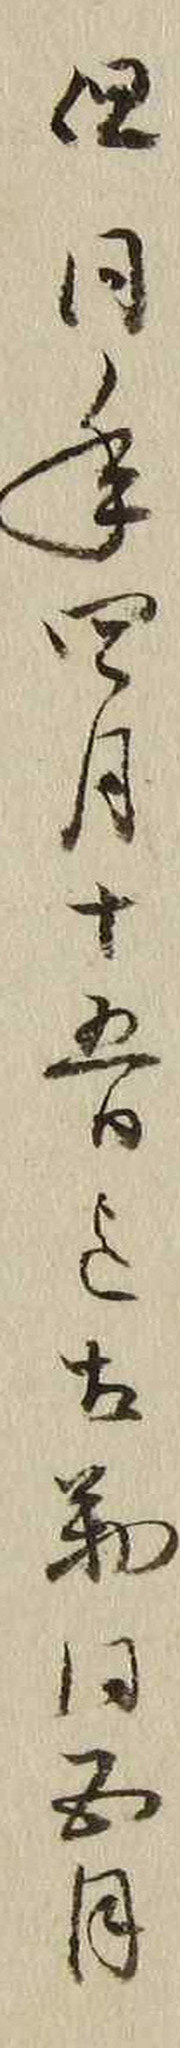但同年四月十五日迄相勤同五月
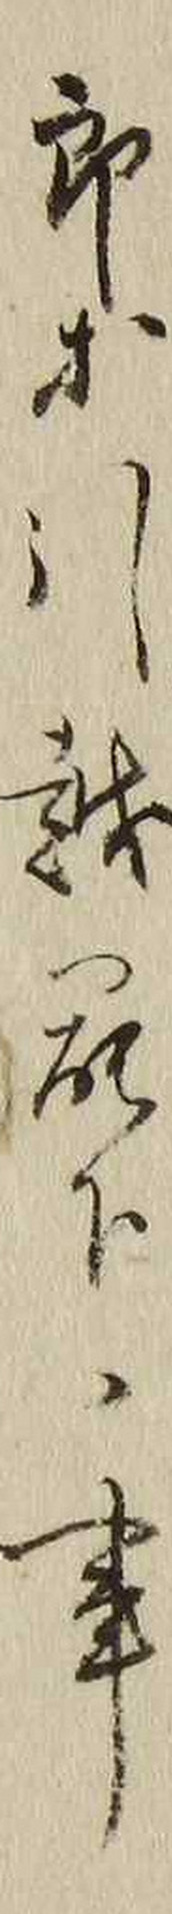郎等引越罷下候事
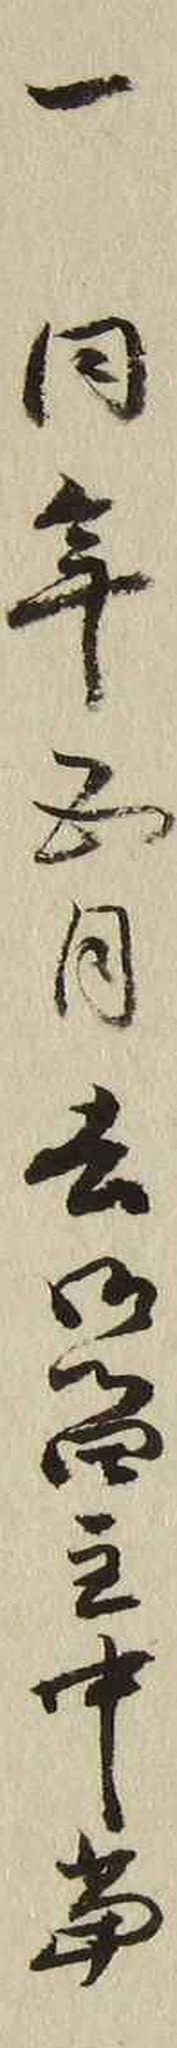一同年五月去御留主中当
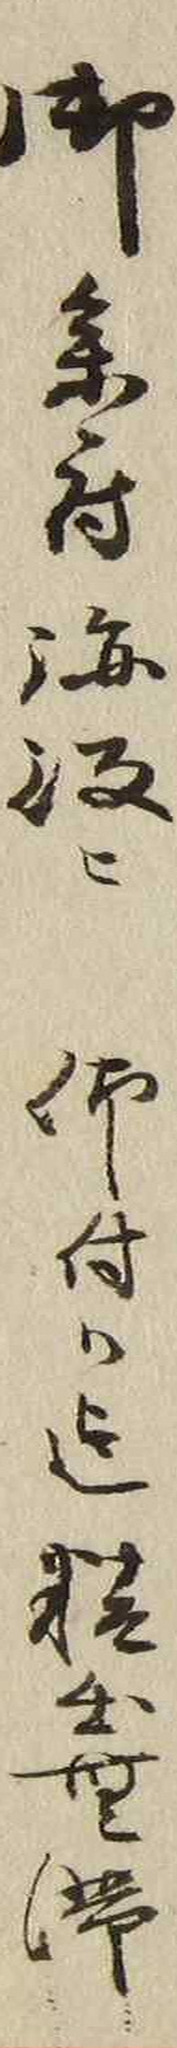御参府跡役被仰付候迄精出無滞
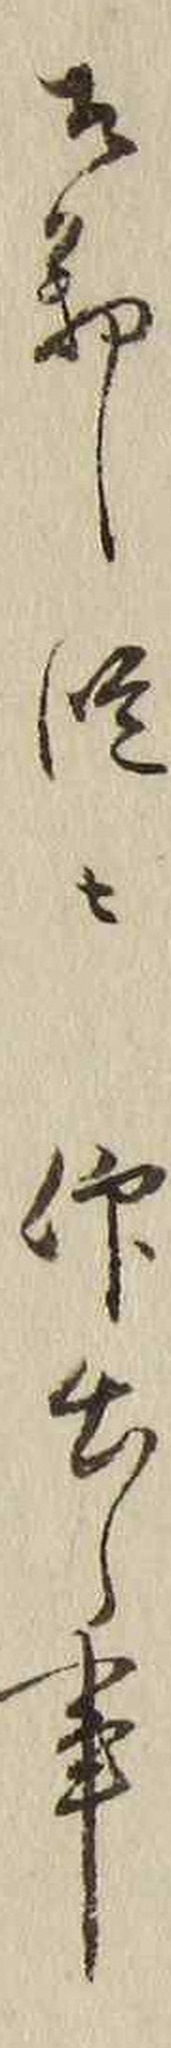相勤候段被仰出候事
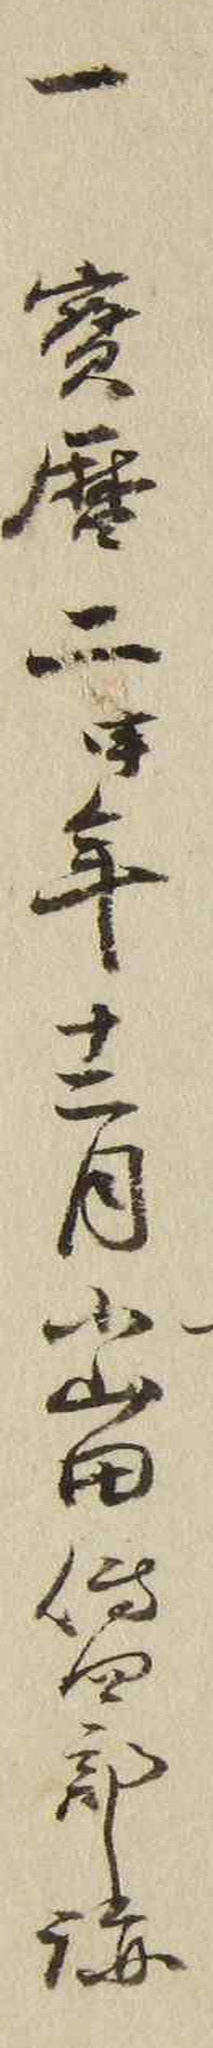一宝暦二申年十二月小山田伝四郎跡

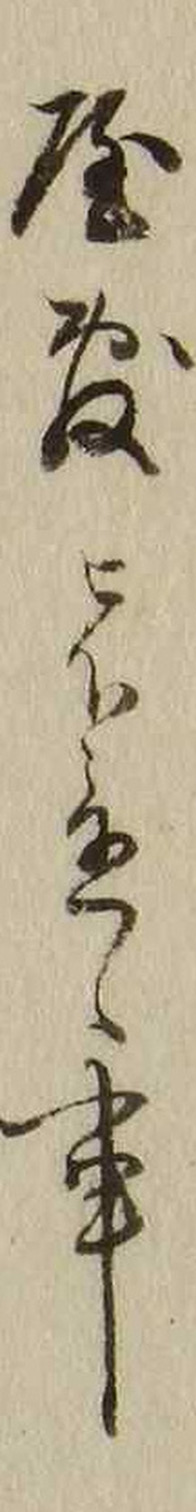屋敷被下置候事
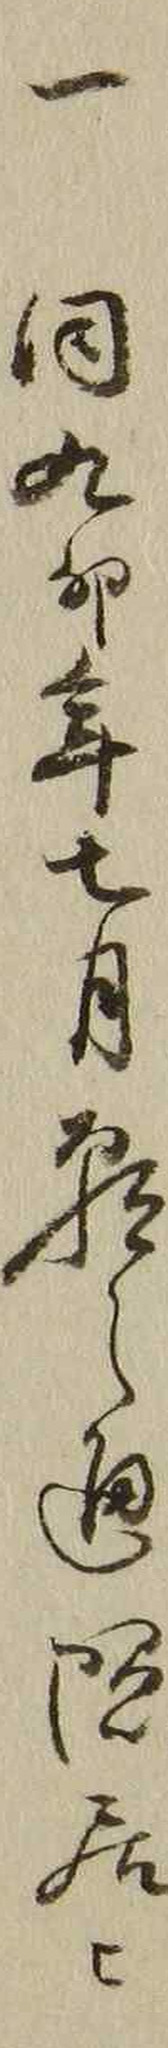一同九卯年七月願之通隠居被
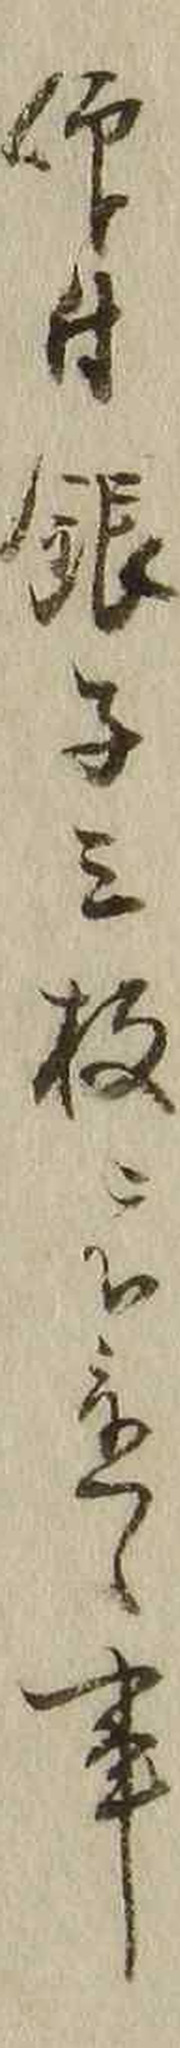仰付銀子三枚被下置候事
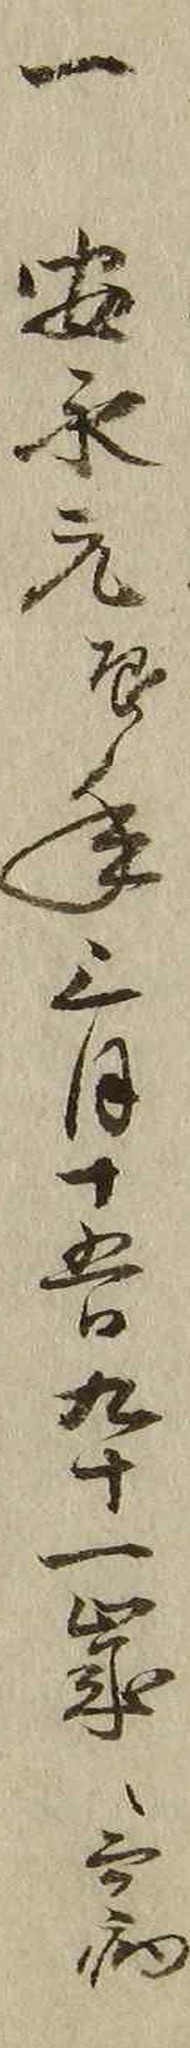一安永元辰年三月十五日九十一歳ニ而病
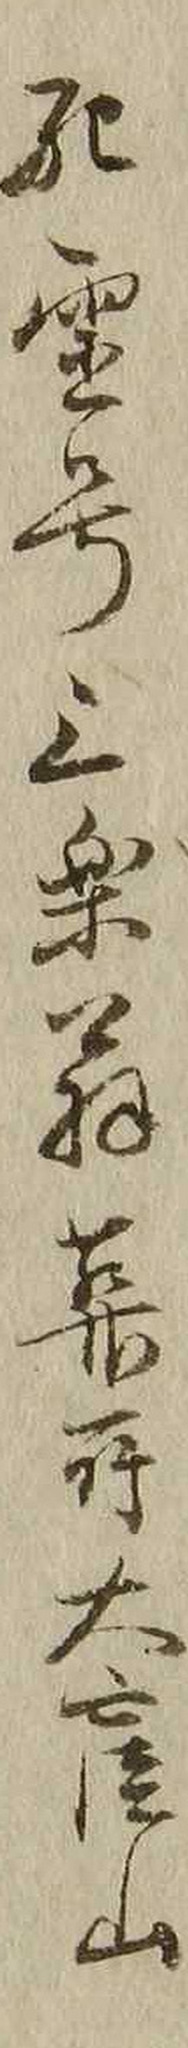死霊号三楽翁葬所大窪山
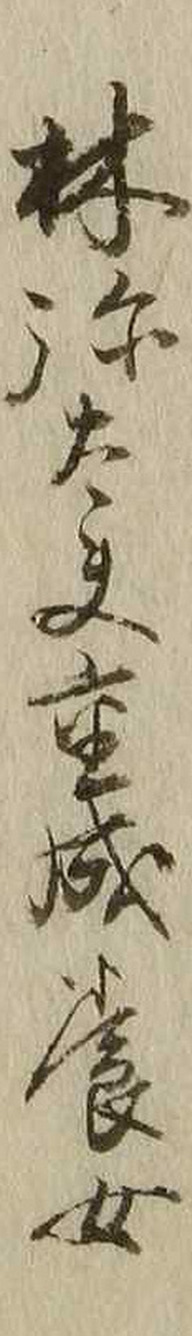女林弥太夫重成養女
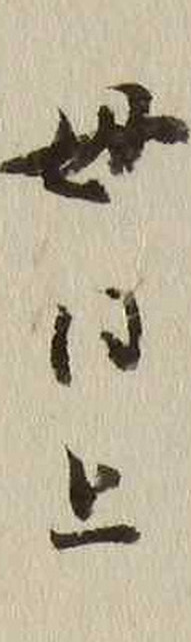母同上
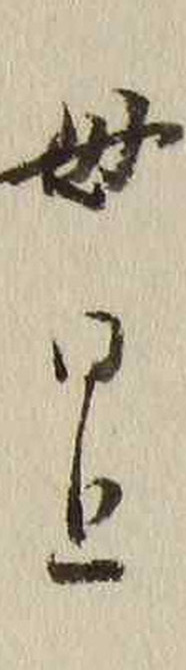母同上

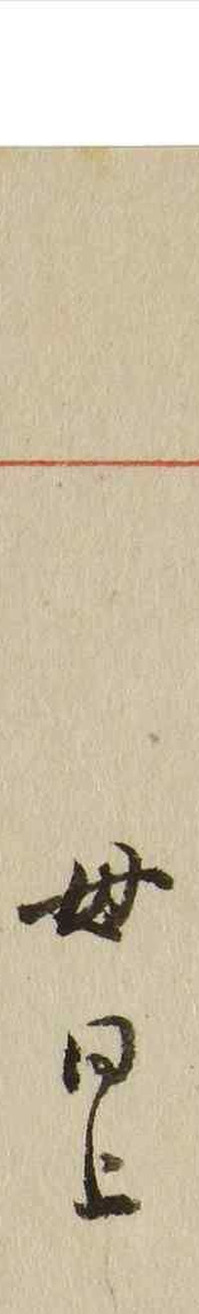母同上
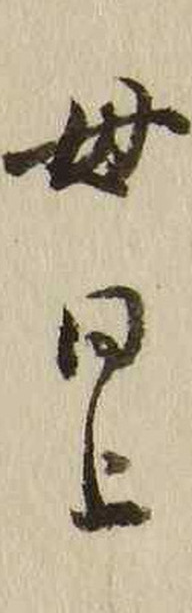母同上
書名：諸士系譜　巻之225　ま之部6
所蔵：会津若松市立会津図書館
